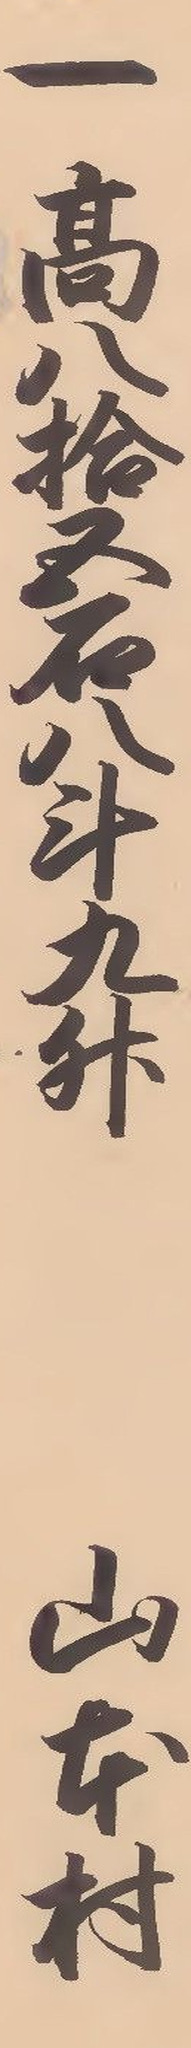一高八拾五石八斗九升山本村

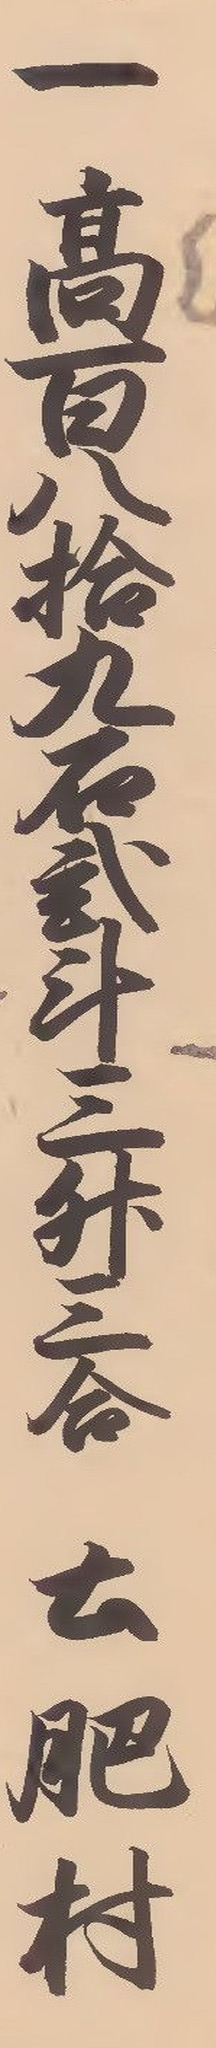一高百八拾九石弐斗三升三合土肥村
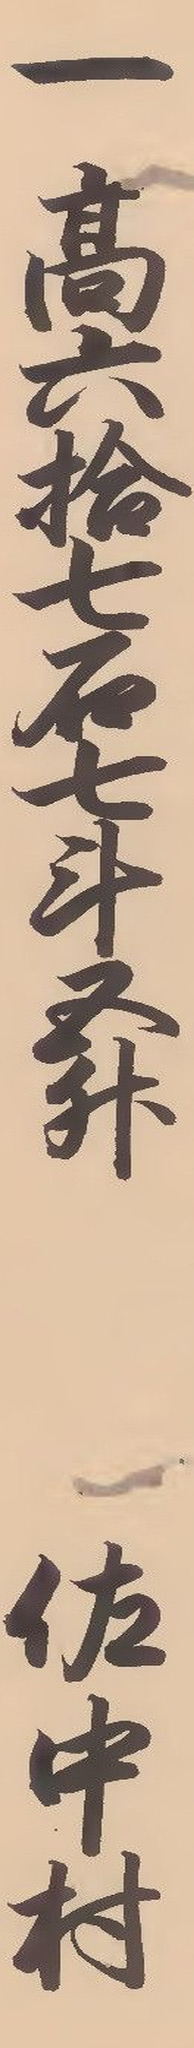一高六拾七石七斗五升佐中村
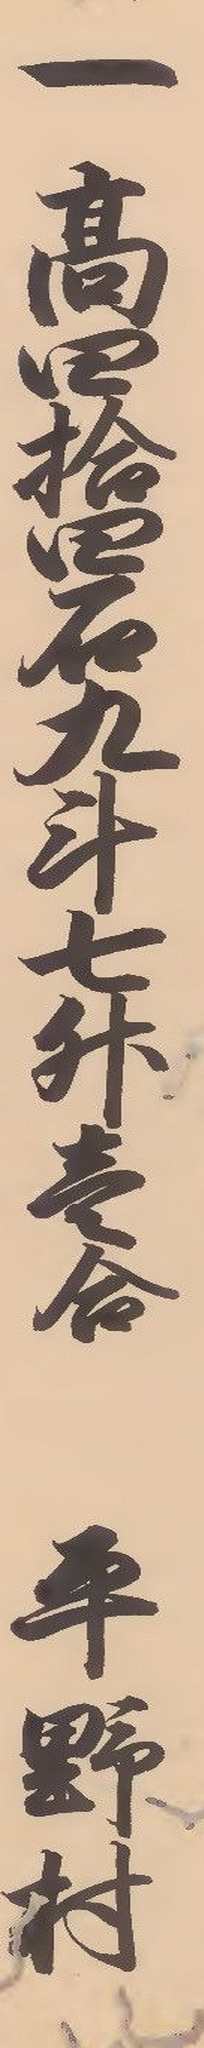一高四拾四石九斗七升壱合平野村
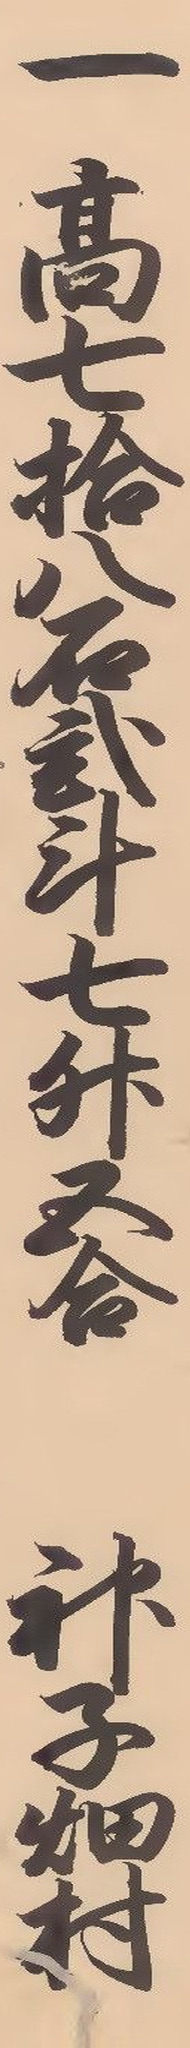一高七拾八石弐斗七升五合神子畑村
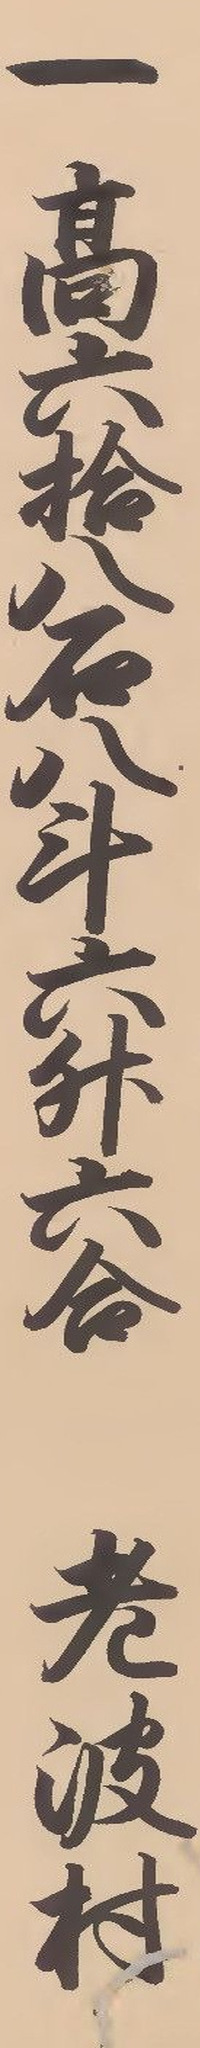一高六拾八石八斗六升六合老波村
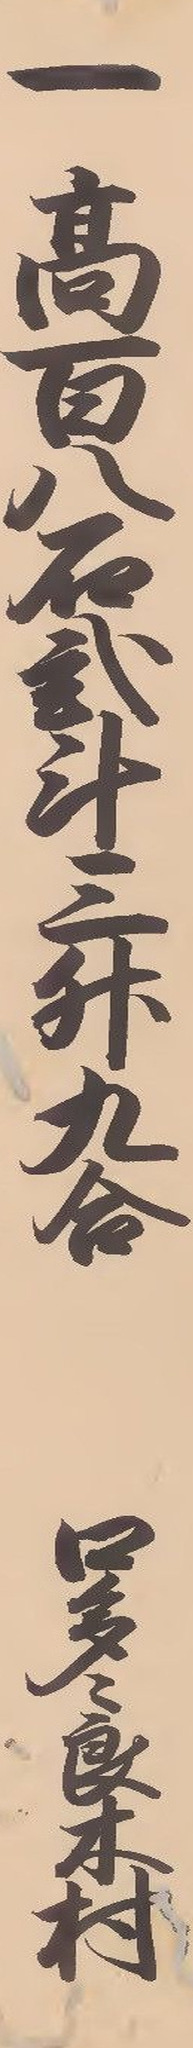一高百八石弐斗三升九合口多々良木村
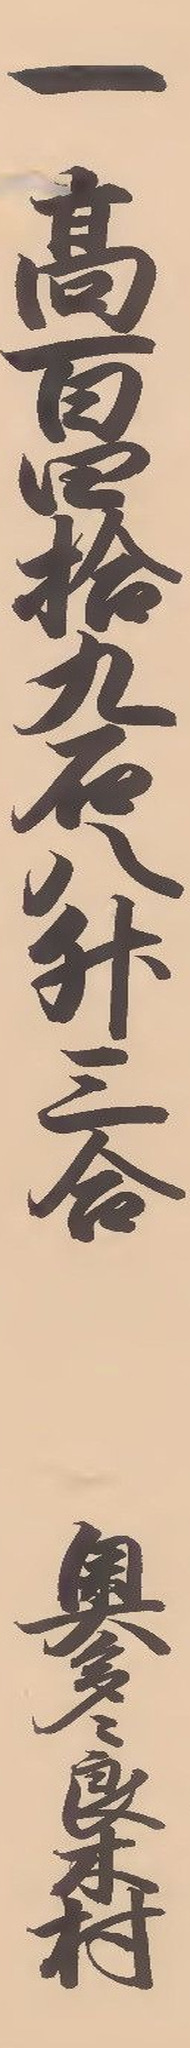一高百四拾九石八升三合奥多々良木村
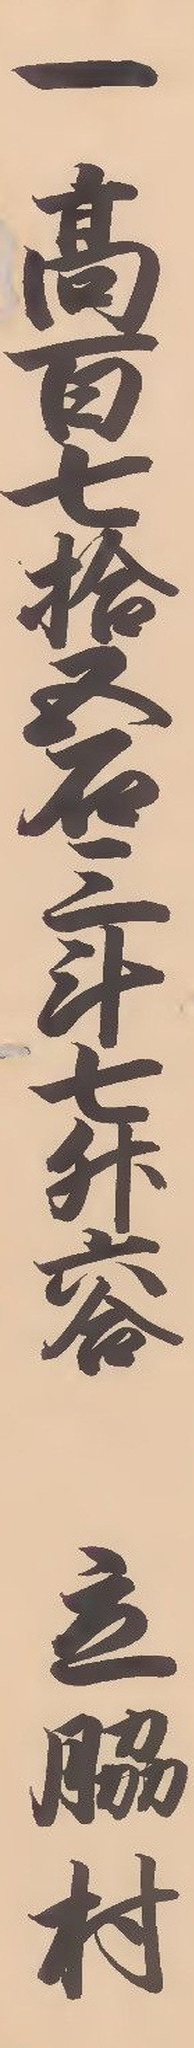一高百七拾五石三斗七升六合立脇村

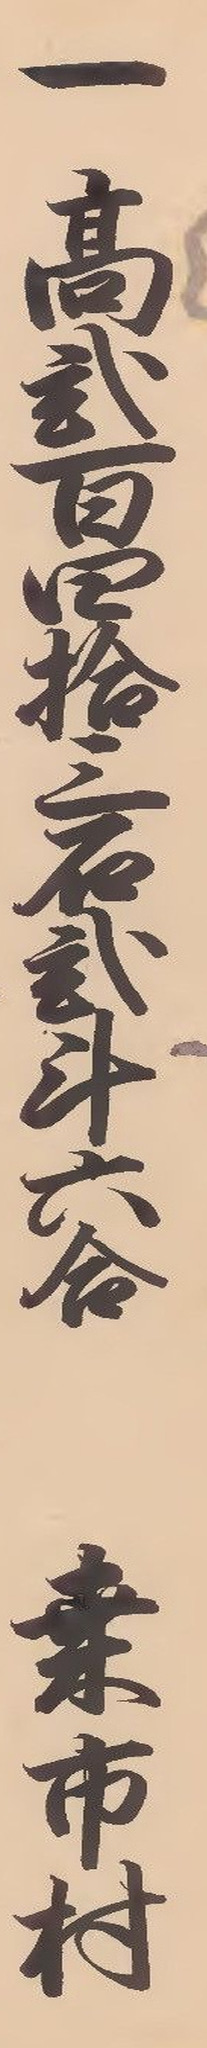一高弐百四拾三石弐斗六合桒市村
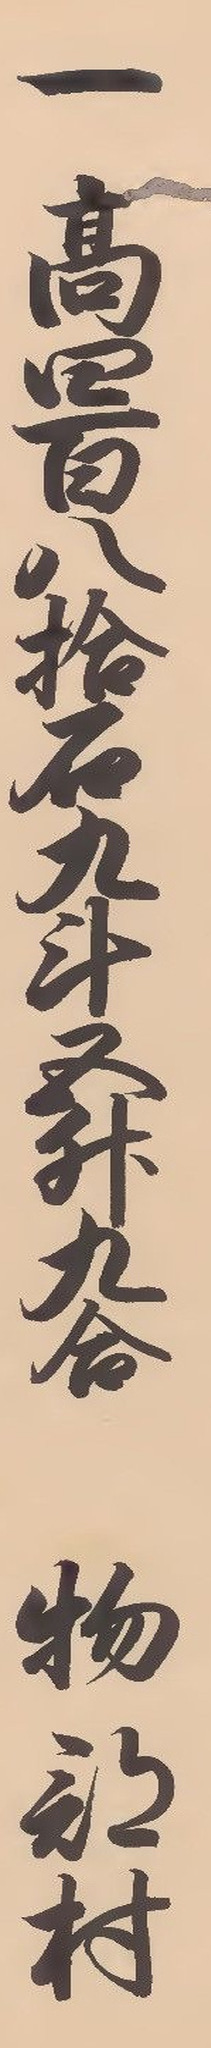一高四百八拾石九斗五升九合物部村
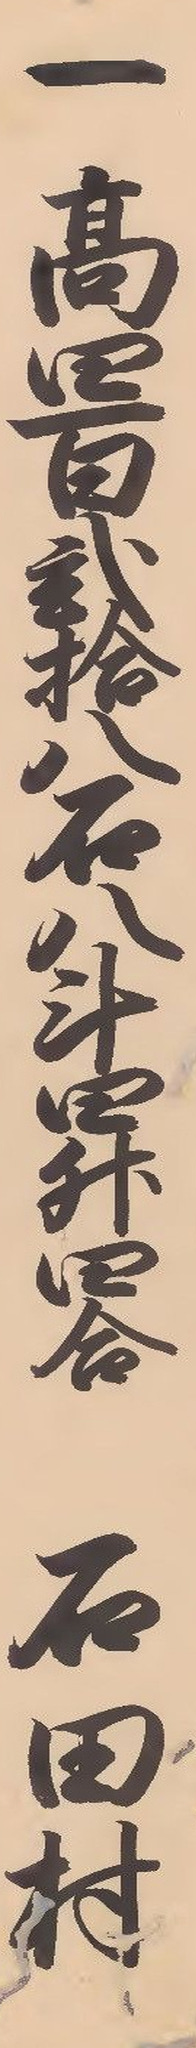一高四百弐拾八石八斗四升四合石田村
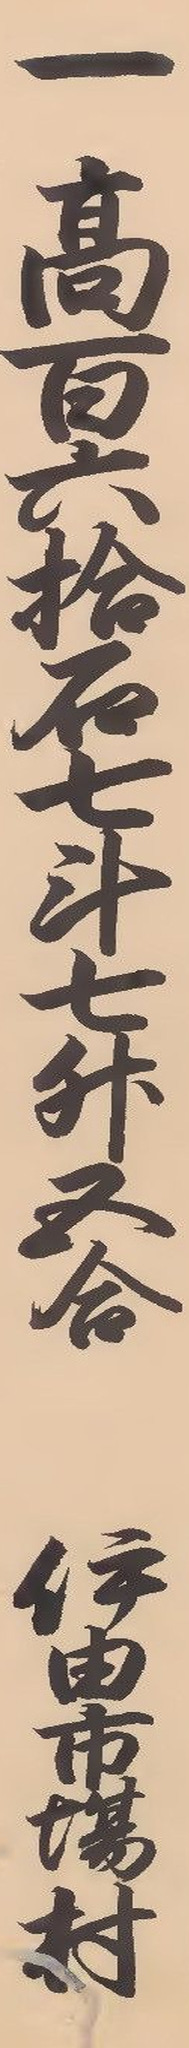一高百六拾石七斗七升五合伊由市場村
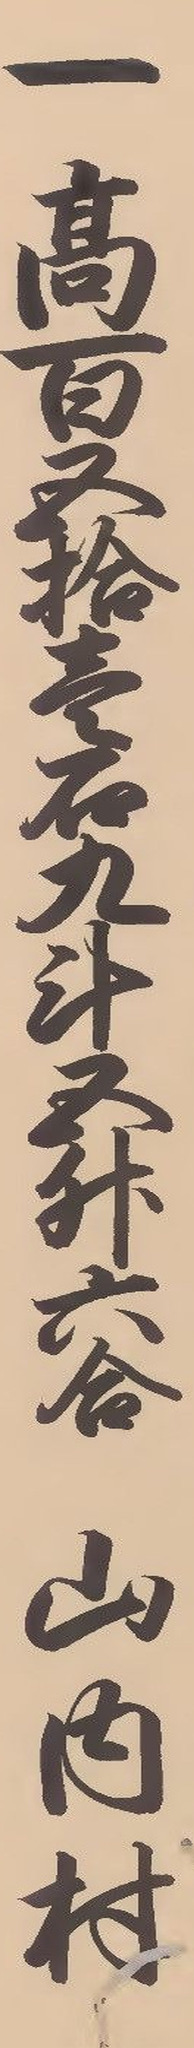一高百五拾壱石九斗五升六合山内村
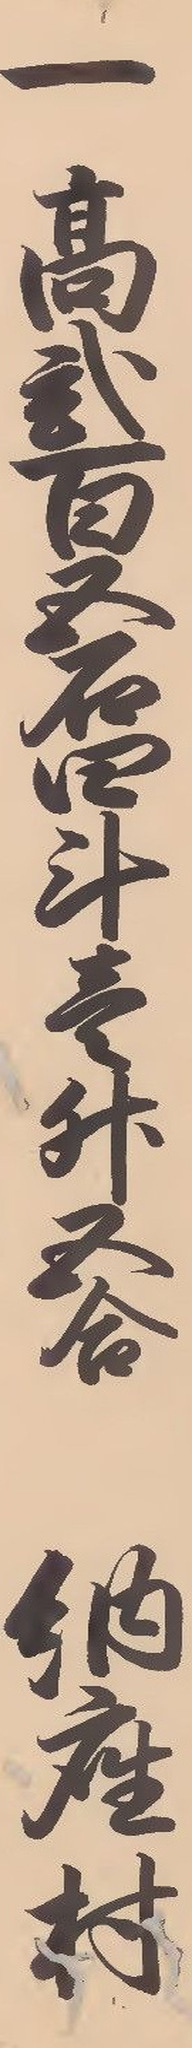一高弐百五石四斗壱升五合納座村
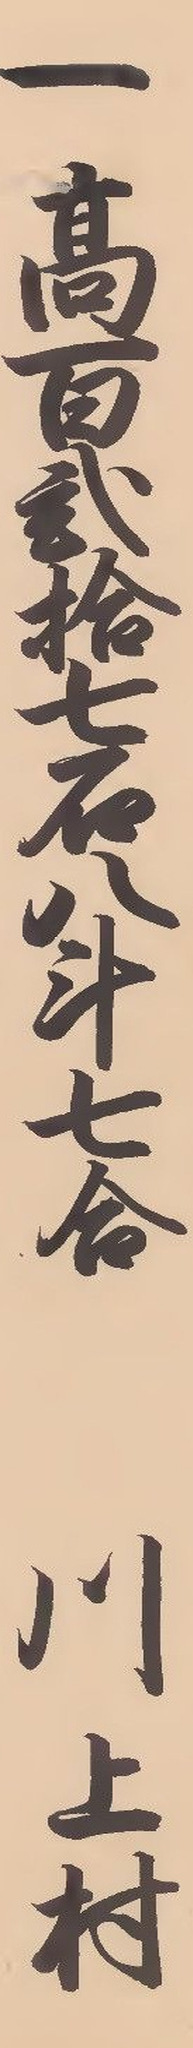一高百弐拾七石八斗七合川上村
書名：但馬国郷帳
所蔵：国立公文書館 National Archives of Japan
